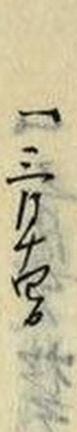一三月十四日
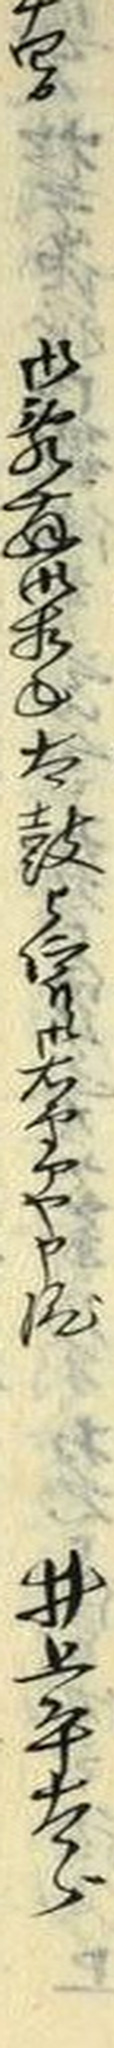御乱舞御相手太鼓被仰付御右筆部屋申渡井上平太郎
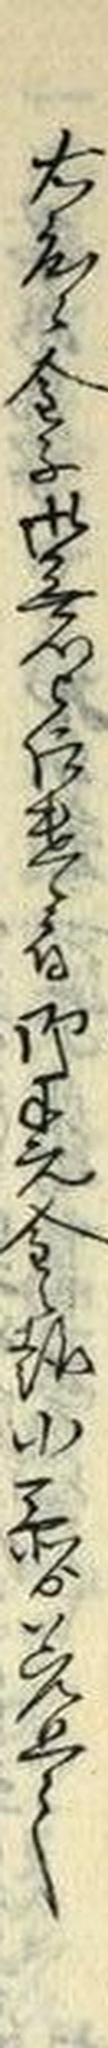右度々金子御無心被仰遣候ニ付御手元金之趣小兵衛ゟ差上之
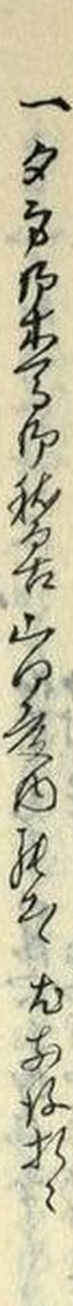一夕方御木馬御稽古山田藤内罷出候尤前後折々
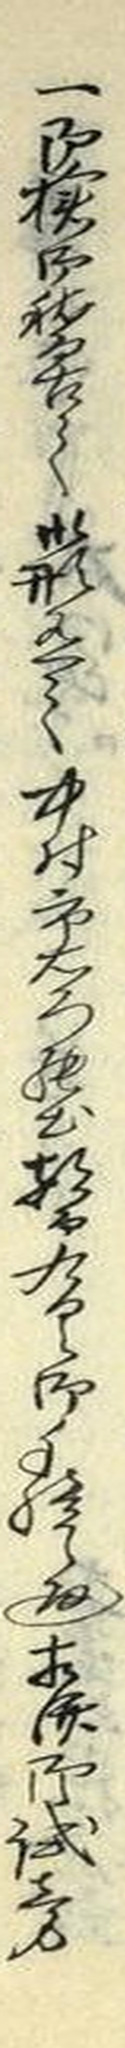一御槍御稽古之御形有之中村市右衛門罷出都而九日之御手続之通相済御試旁
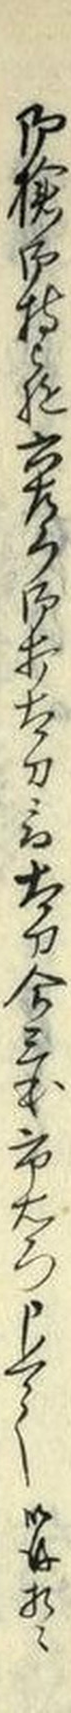御槍御持被遊六左衛門御打太刀ニ而太刀合三本市右衛門申上之以後折々
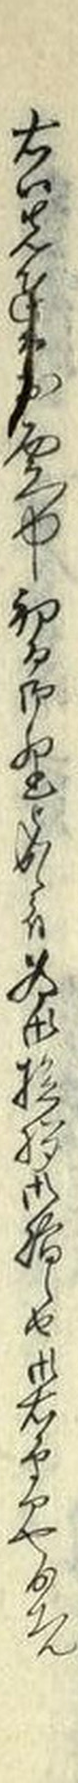右ハ先達而於殿中初而御逢被成候ニ付為御挨拶御贈之由御右筆部屋ゟ出ル
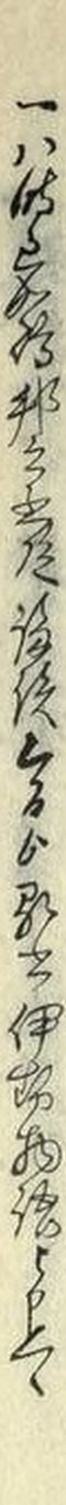一八時過成嶋邦之丞殿講談今日ゟ歌書伊勢物語被申上候
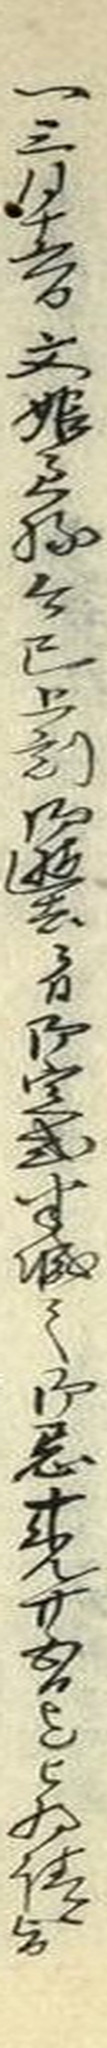一三月十六日文姫君様今巳上刻御逝去ニ付御定式半減之御忌来ル廿五日迄被為請候旨
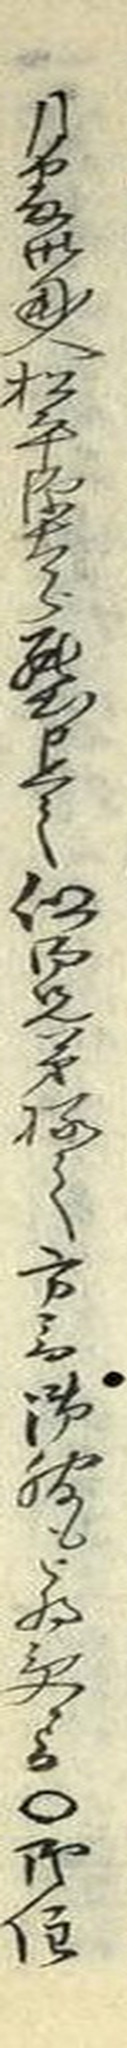月番御用人松平源太郎罷出申上之但御兄弟様之方ニ而御服も被為受候旨〇御住
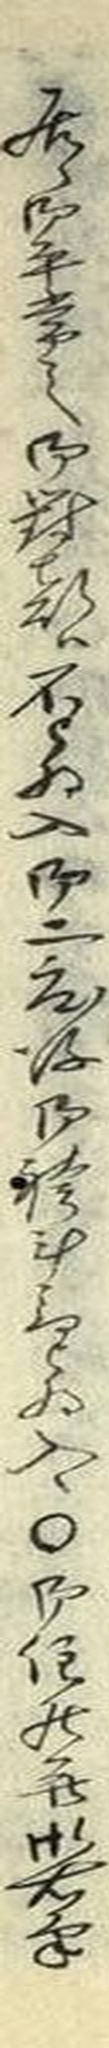居へ御平常之御対顔ハ不被為入御二度後御袴斗ニ而被為入候〇御住居幷御右筆
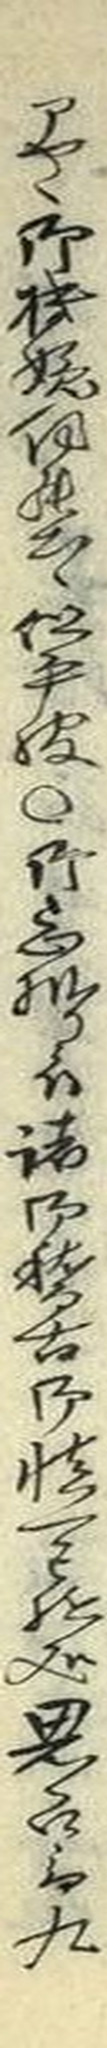部屋へ御機嫌伺罷出候但平服〇御忌掛りニ付諸御稽古御慎可被遊処思召ニ而九
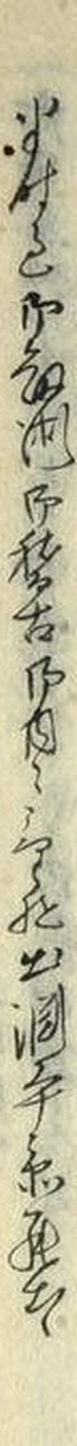半時過御剣術御稽古御内々ニ而被遊出淵平兵衛罷出候
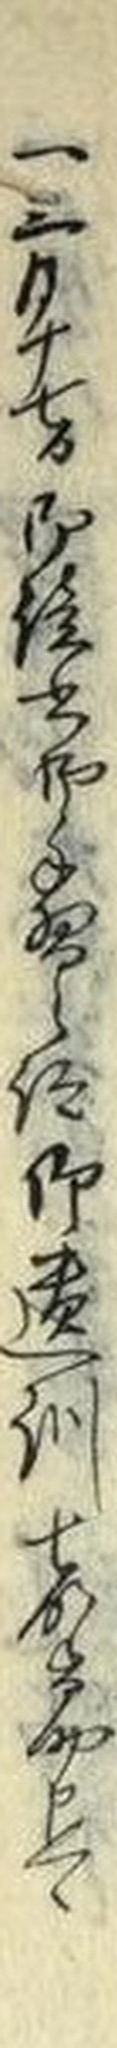一三月十七日御読書御手習之跡御遺訓馨助申上候

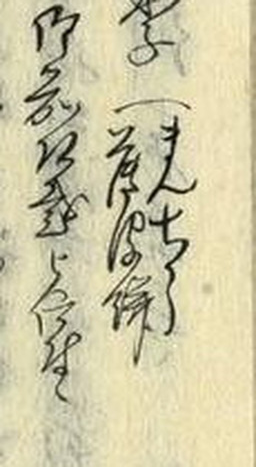薄皮餅
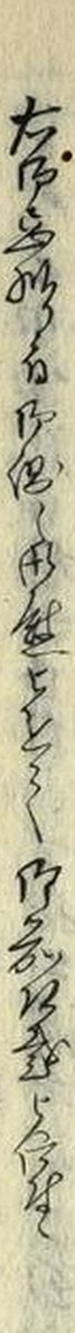右御忌掛りニ付御側之御慰被進之御前頂戴被仰付候
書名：少傅日録抄（斉善付側向頭取日記、在府）
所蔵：福井県文書館 Fukui Prefectural Archives
